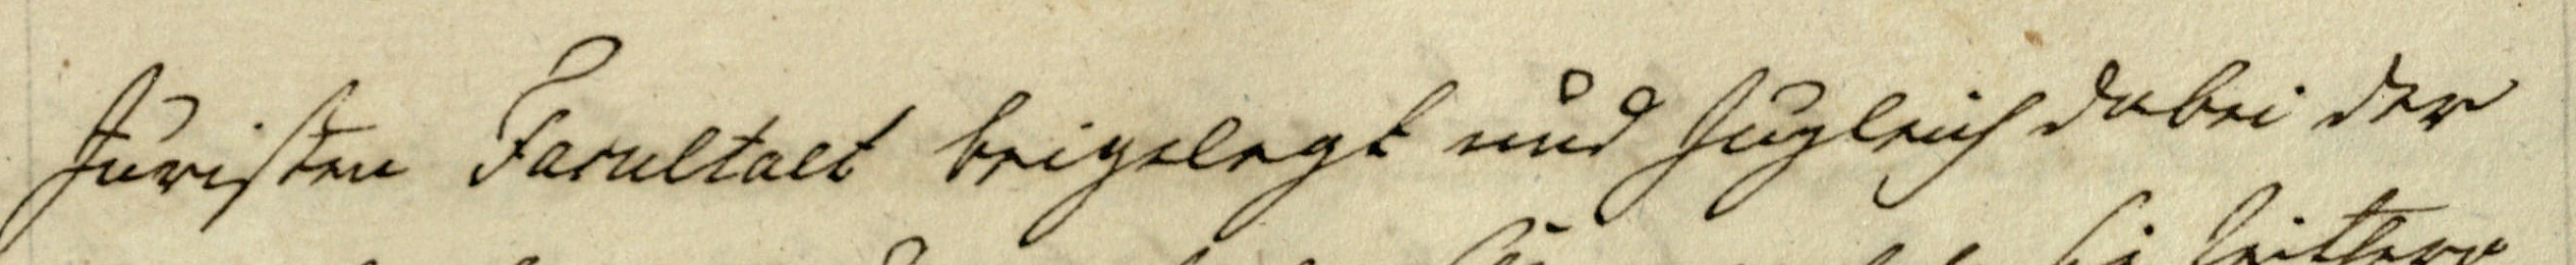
Juristen Facultaet beigelegt und zugleich dabei der
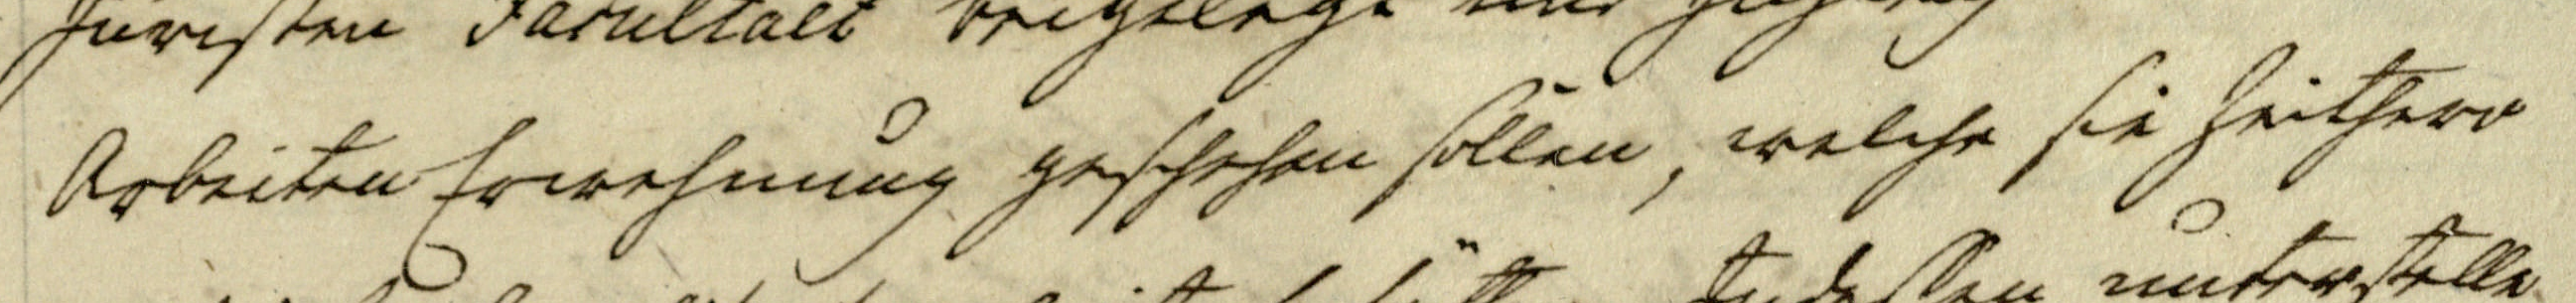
Arbeiten Erwehnung geschehen sollen, welche sie zeithero
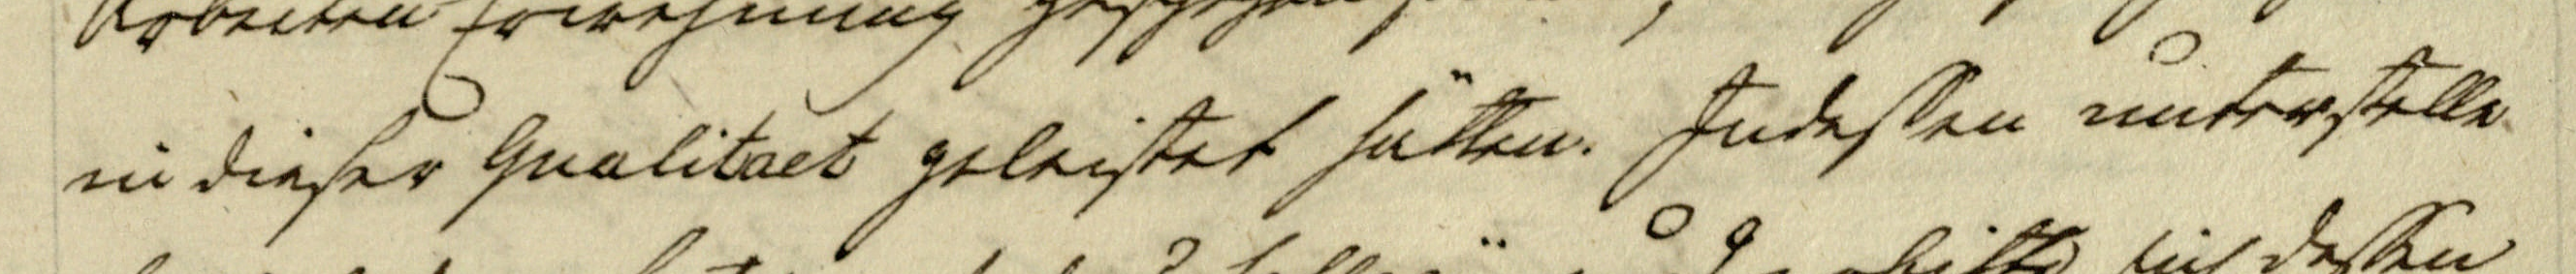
in dieser Qualitaet geleistet hätten. Indessen unterstelle
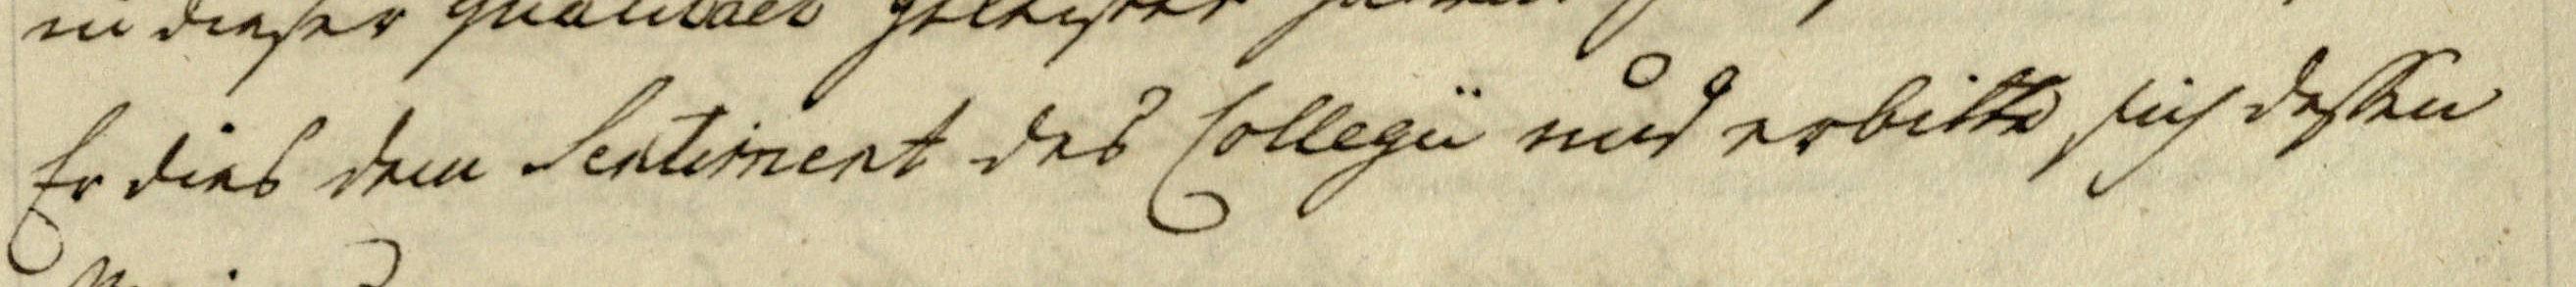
Er dies dem Sentiment des Collegii und erbitte sich dessen
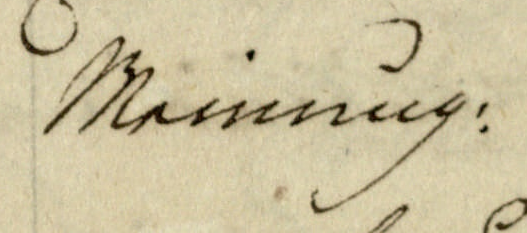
Meinung:
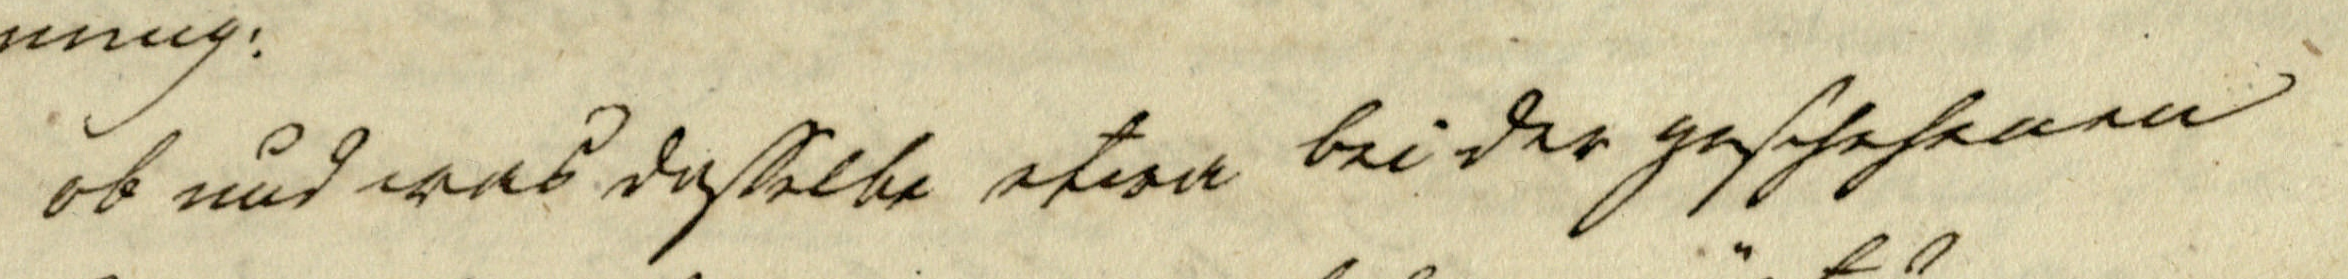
ob und was dasselbe etwa bei der geschehenen
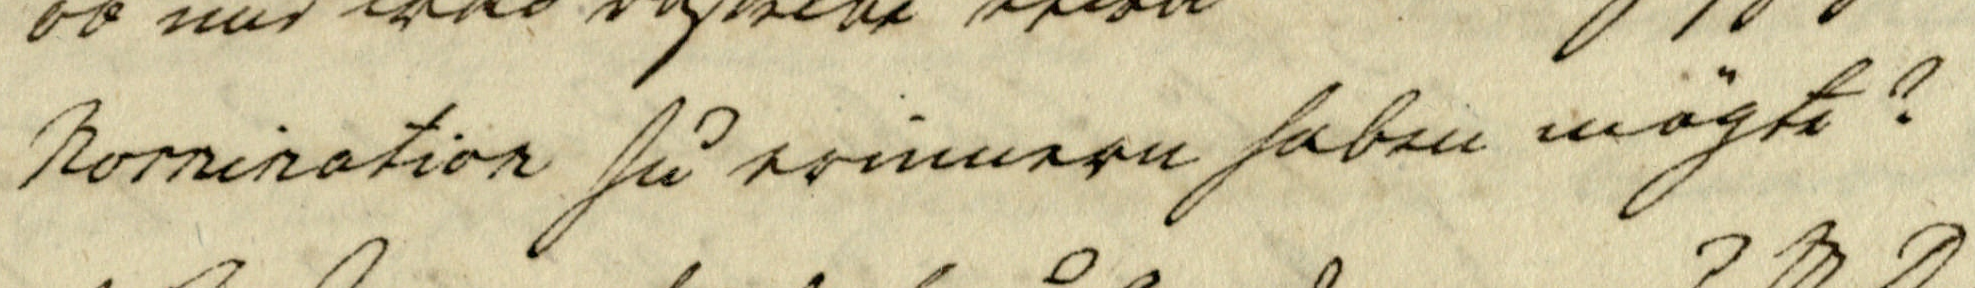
Nomination zu erinnern haben mögte ?
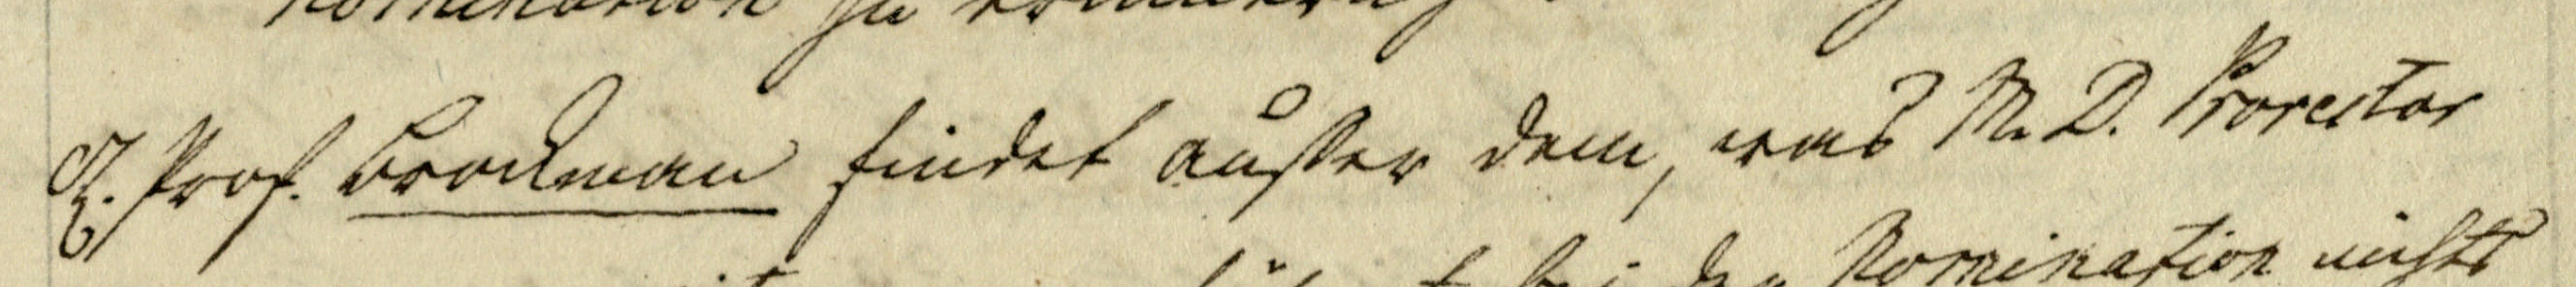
dh. Prof. Brockmann findet ausser dem, was M. D. Prorector
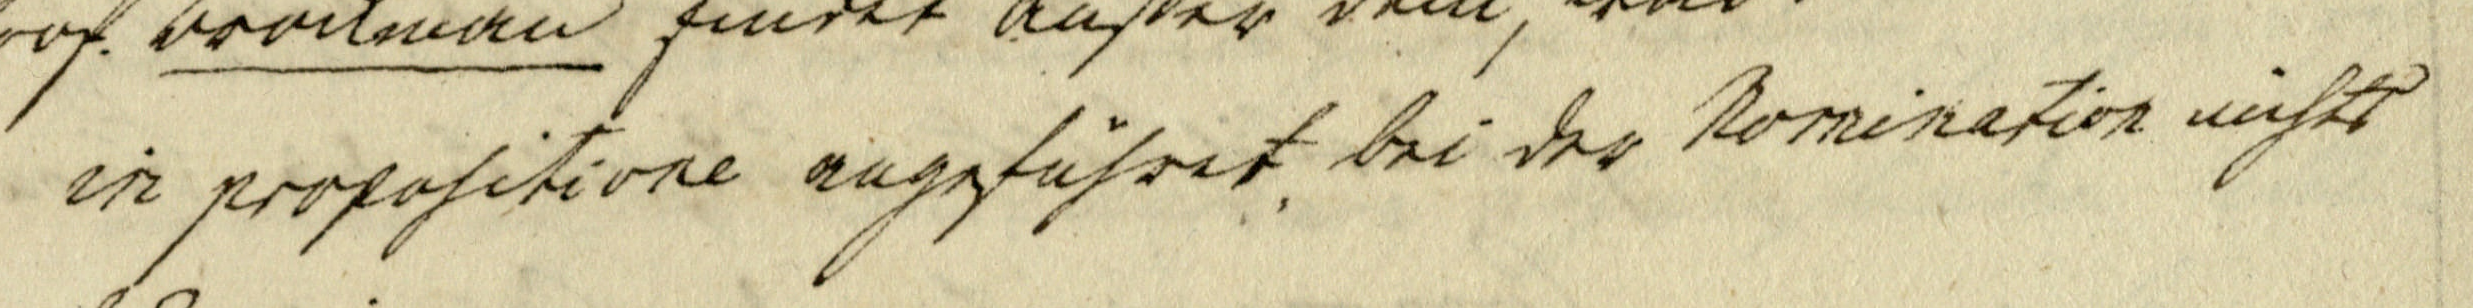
in propositione angeführet bei der Nomination nichts
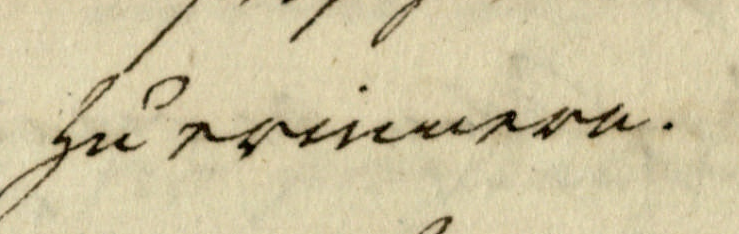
zu erinnern.
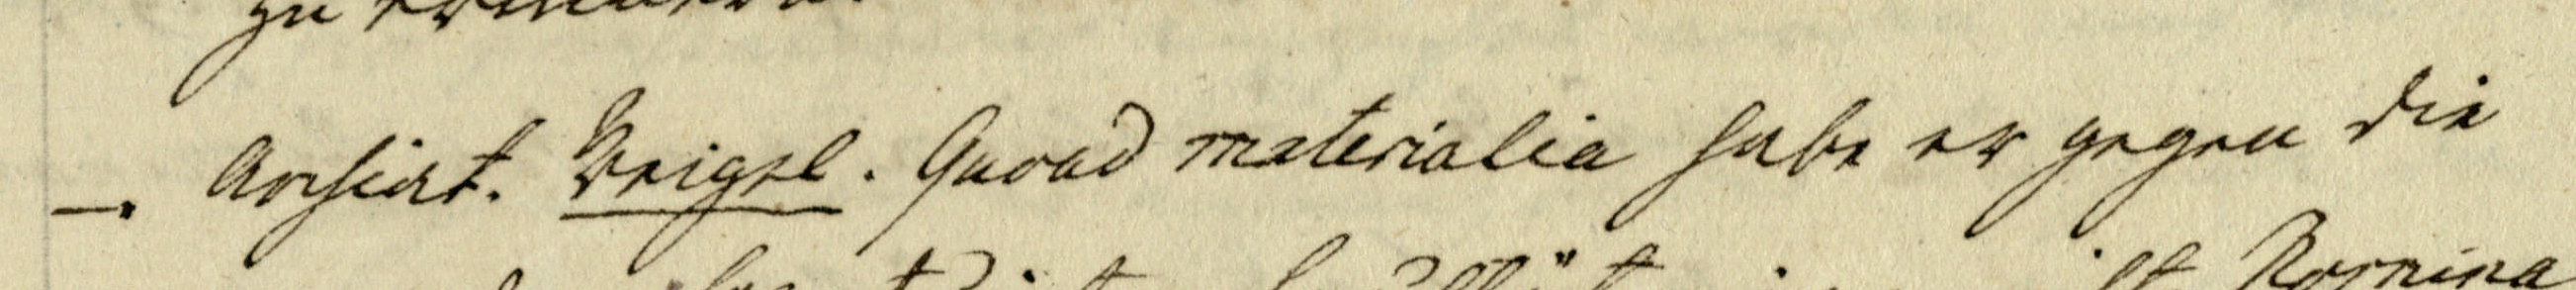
Archiat. Weigel. Quoad materialia habe er gegen die
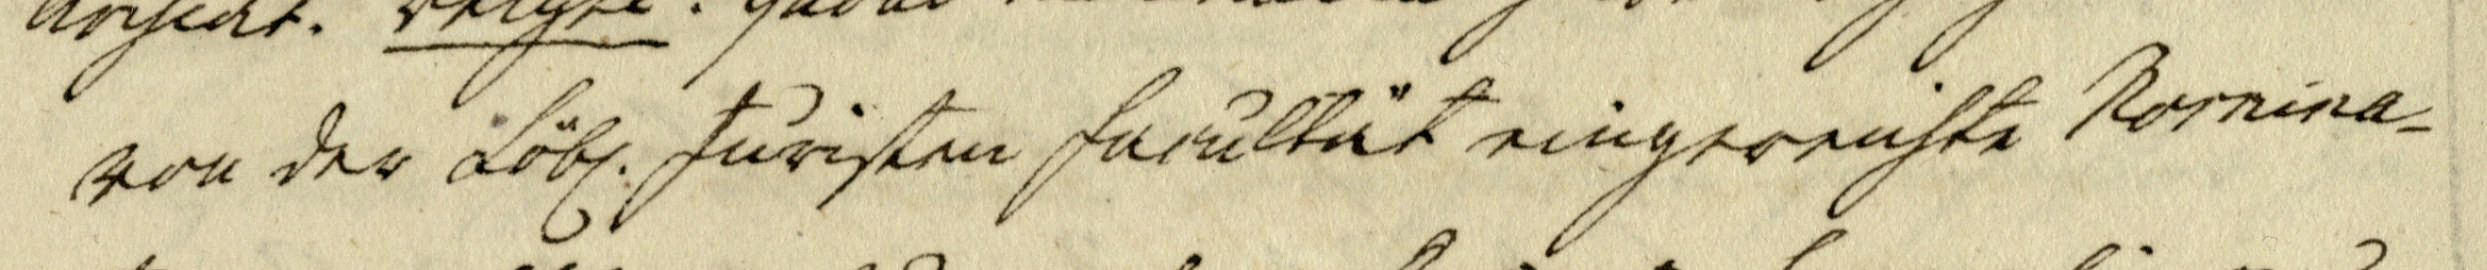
von der Löbl. Juristen Facultät eingereichte Nomina¬
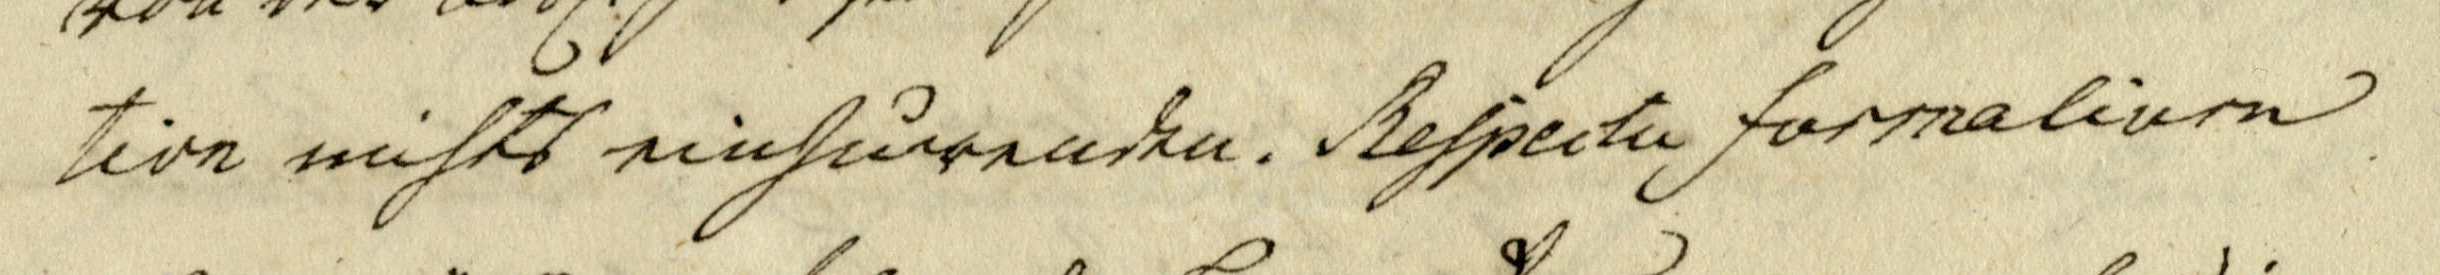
tion nichts einzuwenden. Respectu formalium
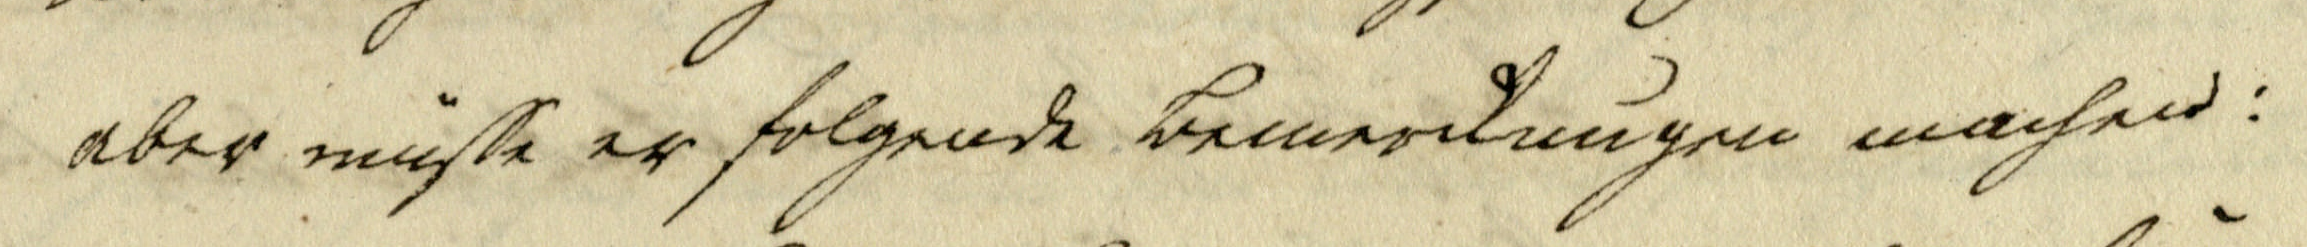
aber müsse er folgende Bemerckungen machen:
